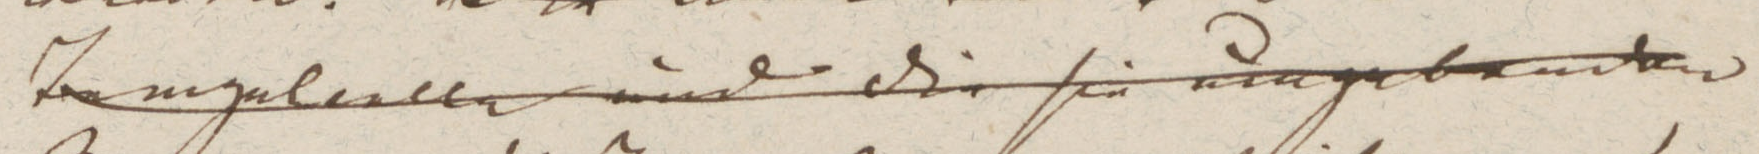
Tempelcella und die sie umgebenden
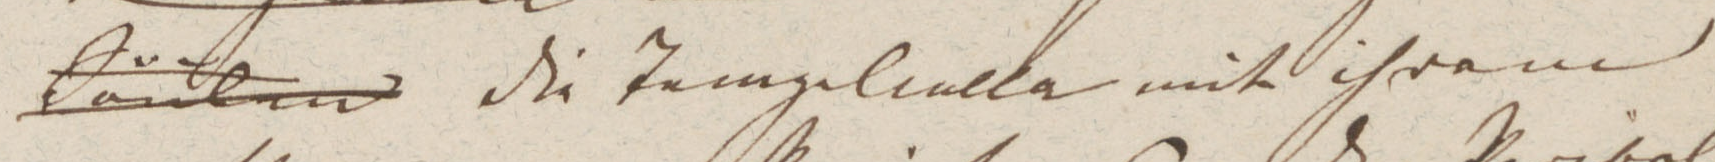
Säulen Die Tempelcella mit ihrem
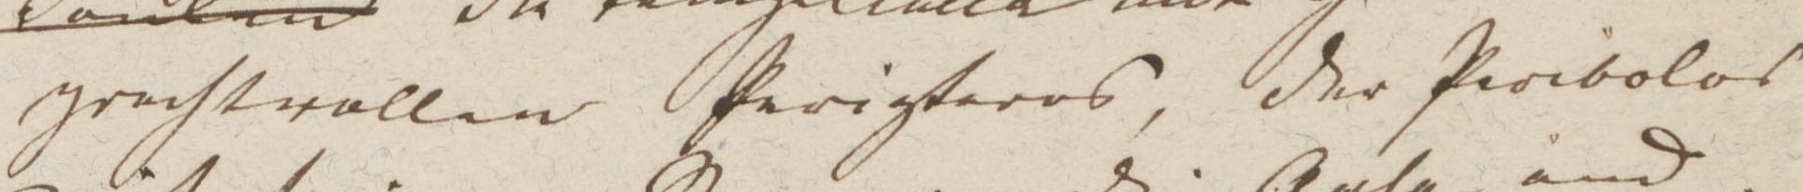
prachtvollen Peripteros, der Peribolos
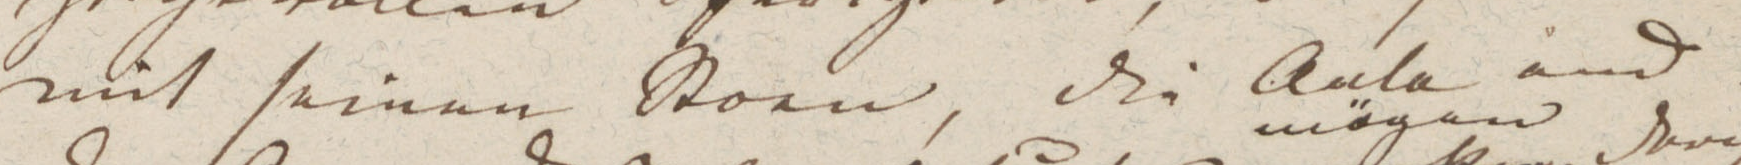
mit seinen Stoen, die Aula und
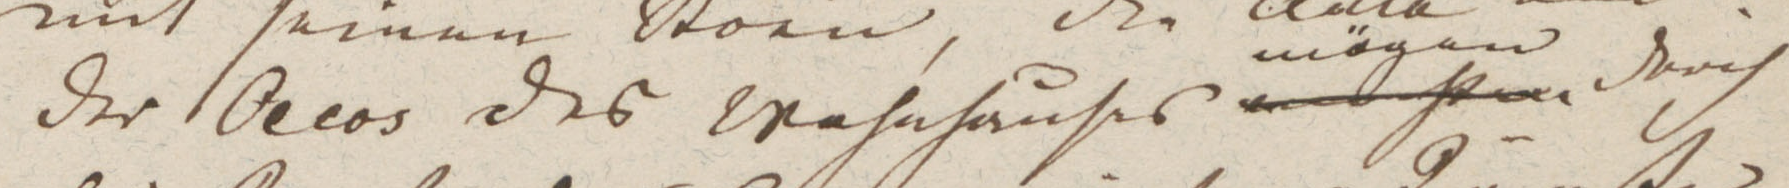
der Oecos des Wohnhauses mchte mögen durch
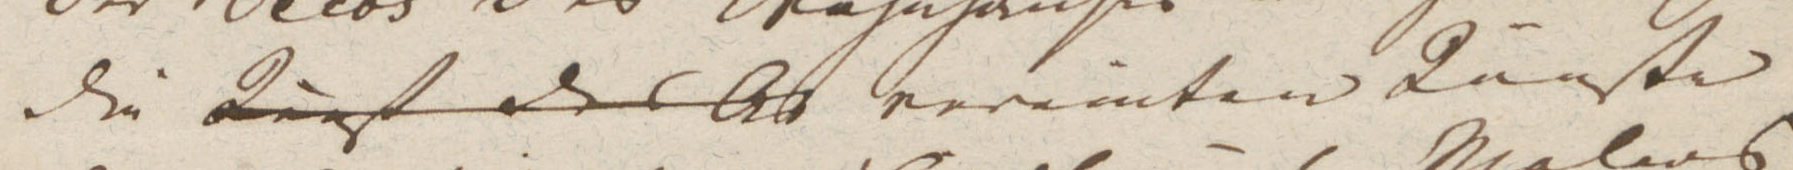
die Kunst des A vereinten Künste
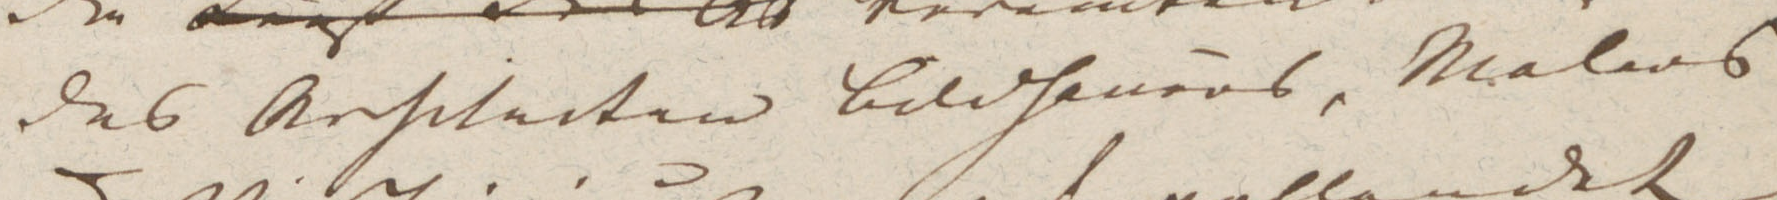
des Architecten Bildhauers, Malers
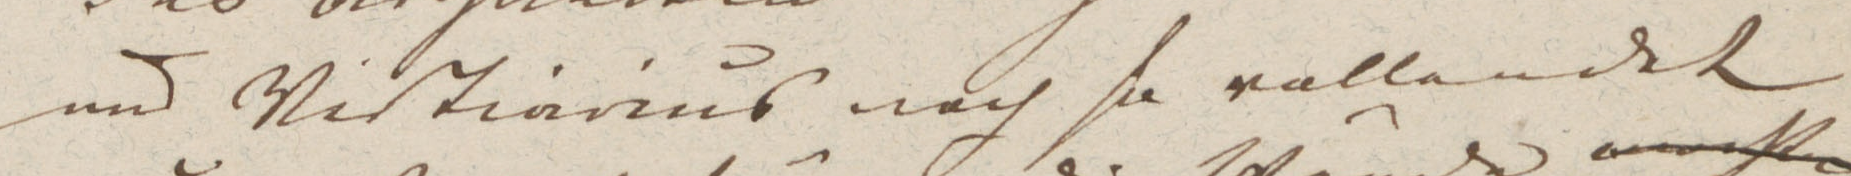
und Vestiarius noch so vollendet
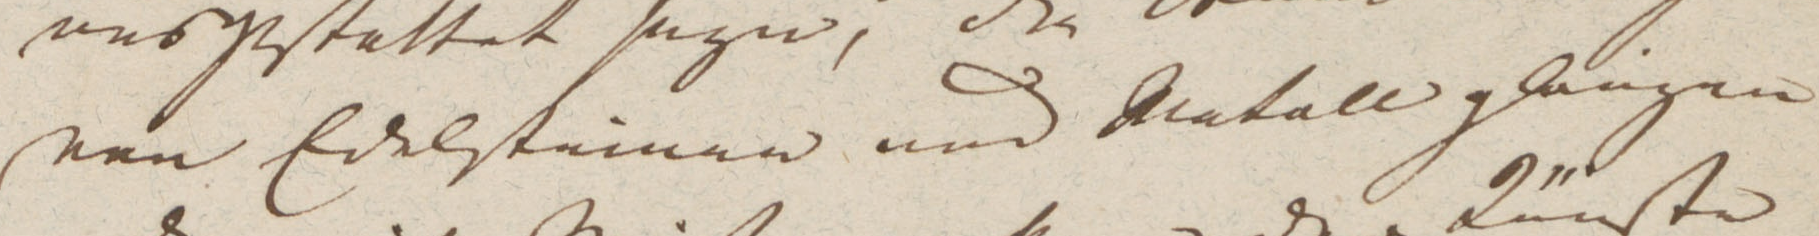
von Edelsteinen und Metall glänzen
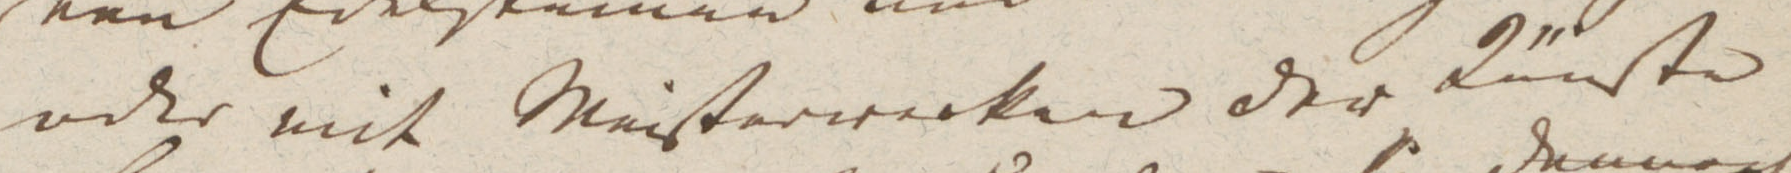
oder mit Meisterwerken der Künste
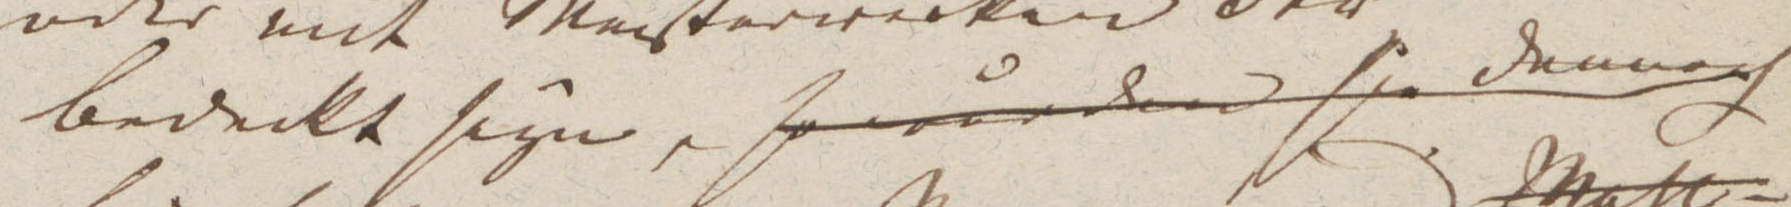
bedeckt seyn, so wurden sie dennoch
